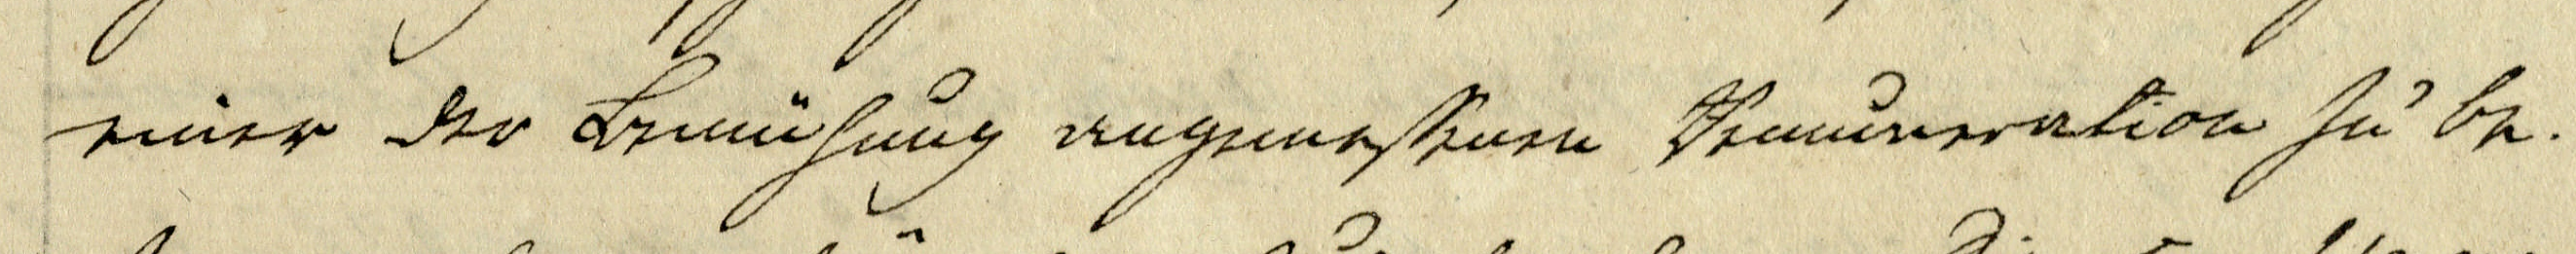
einer der Bemühung angemessenen Remuneration zu be¬
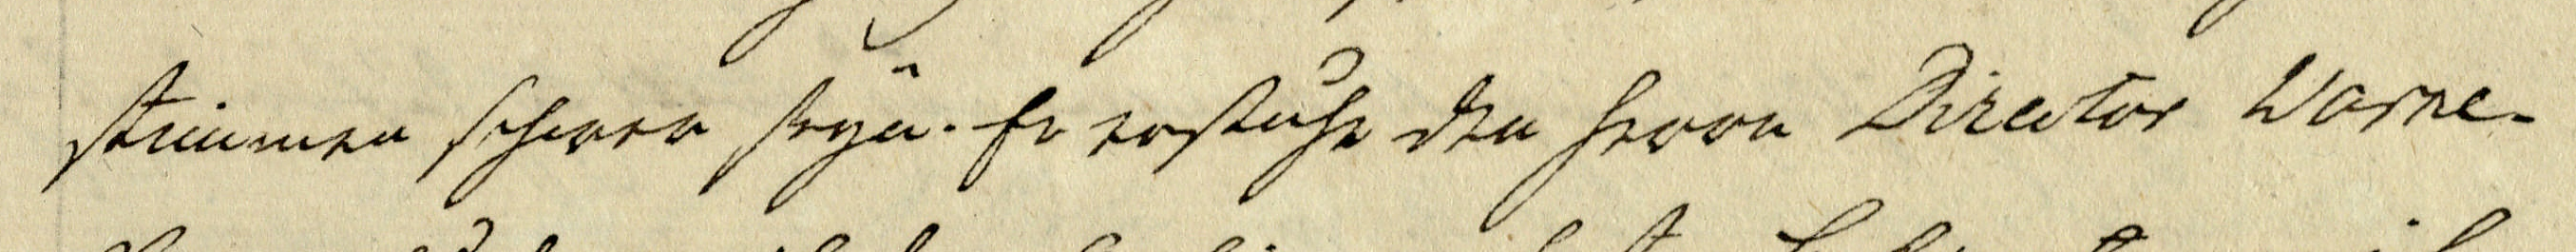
stimmen schwer seÿn. Er ersuche den Herrn Director Warne¬
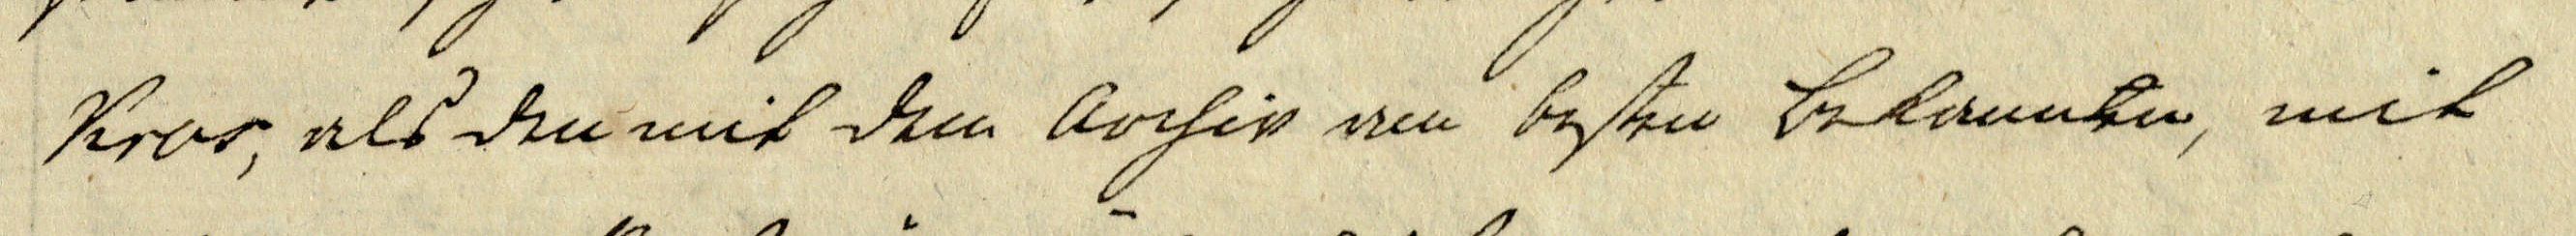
kros, als den mit dem Archiv am besten Bekannten, mit
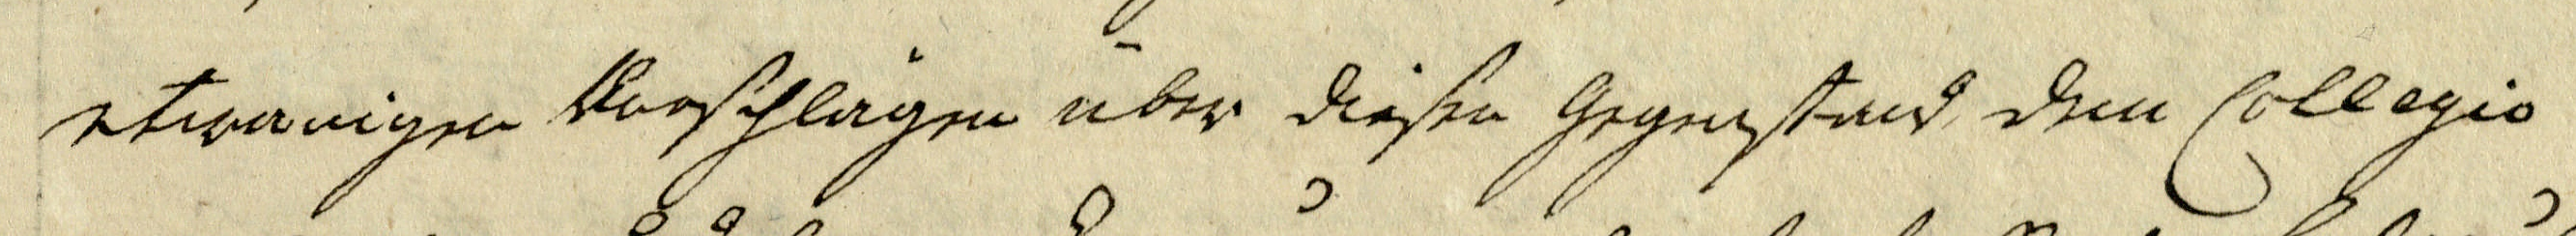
etwanigen Vorschlägen über diesen Gegenstand dem Collegio
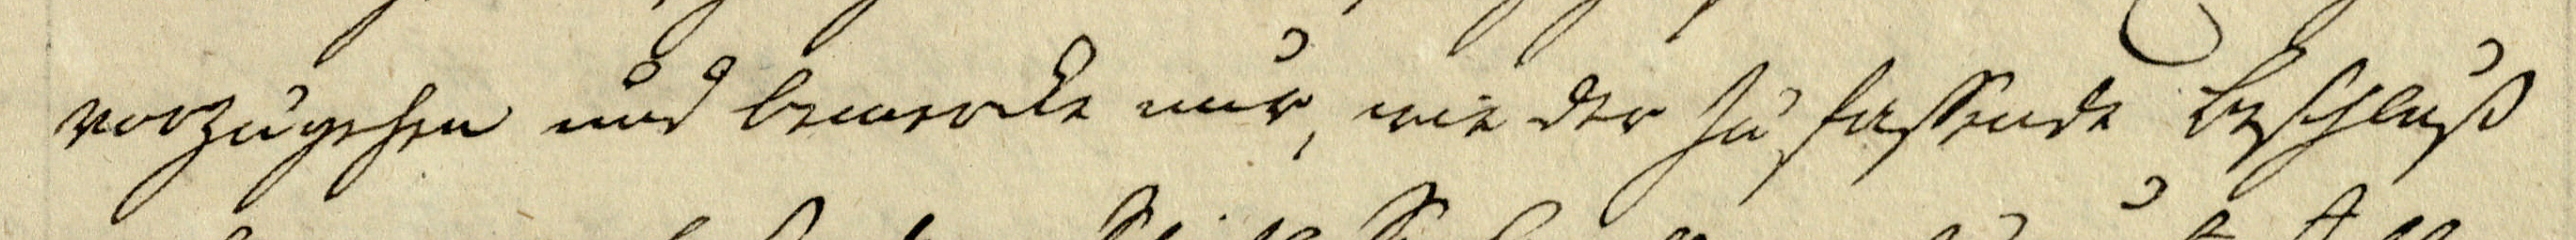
vorzugehen und bemercke nur, wie der zu fassende Beschluß
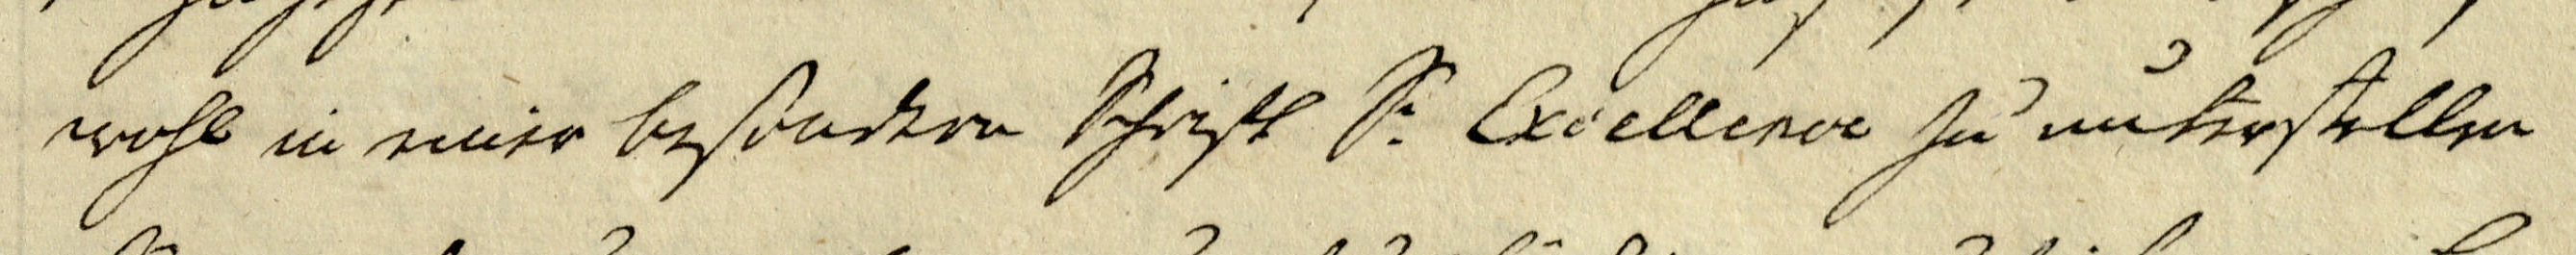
wohl in einer besondern Schrift Sr Excellence zu unterstellen
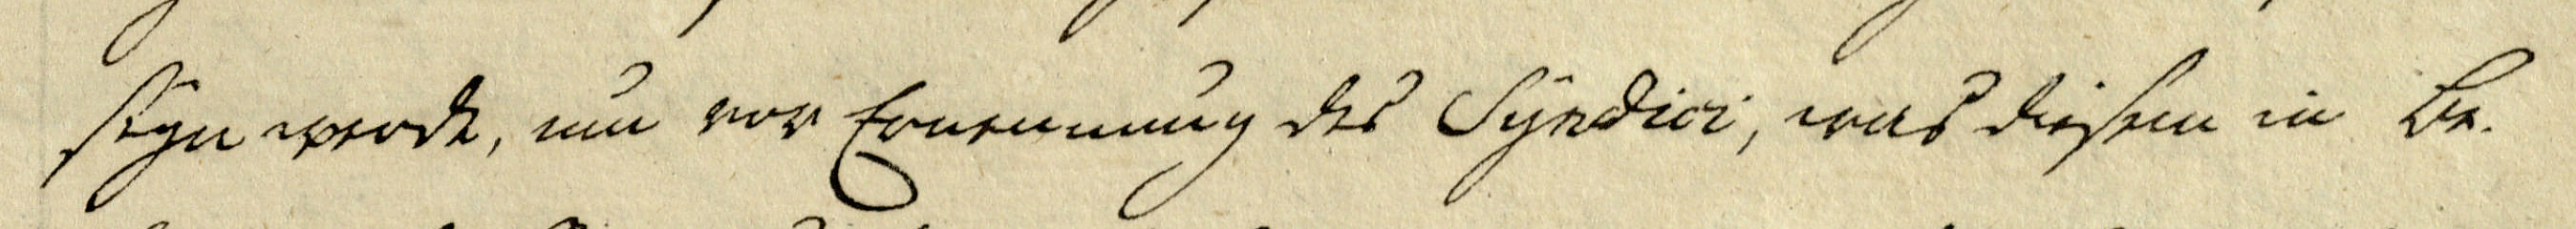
seÿn werde, um vor Ernennung des Sÿndici, was diesem in Be¬
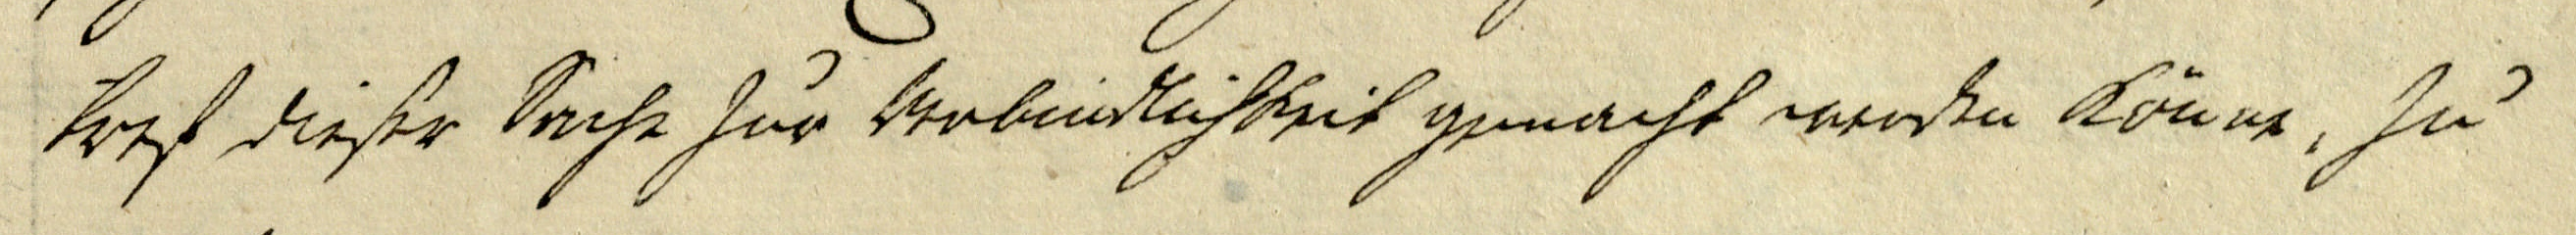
tref dieser Sache zur Verbindlichkeit gemacht werden könne, zu
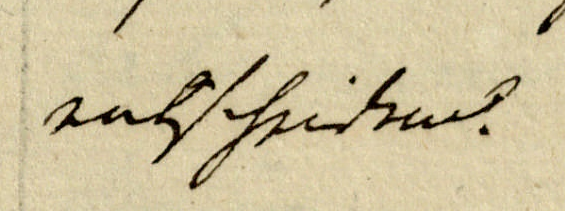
entscheiden.
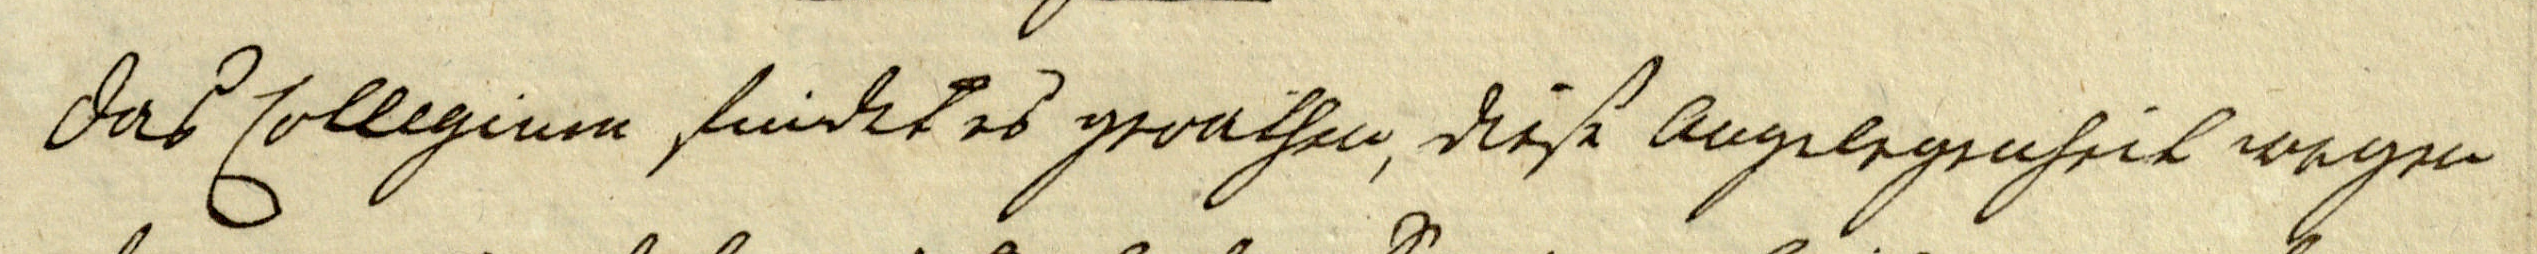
Das Collegium findet es gerathen, diese Angelegenheit wegen
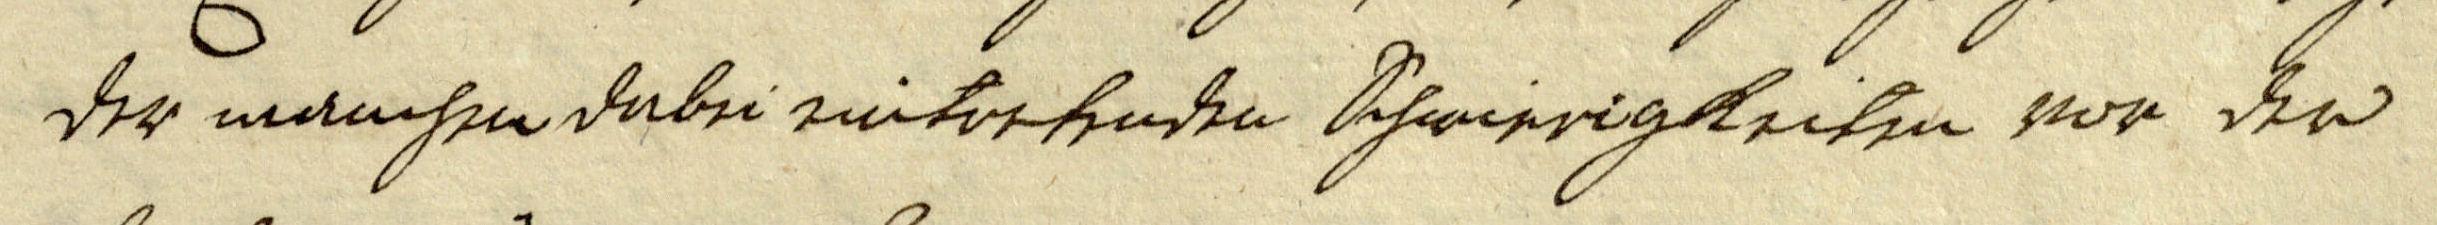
der manchen dabei eintretenden Schwierigkeiten vor der
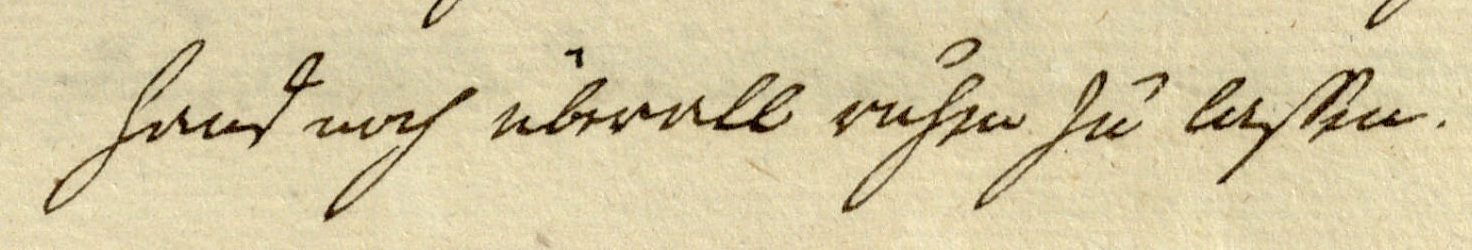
Hand noch überall ruhen zu lassen.
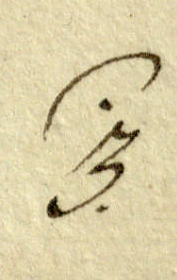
3.
